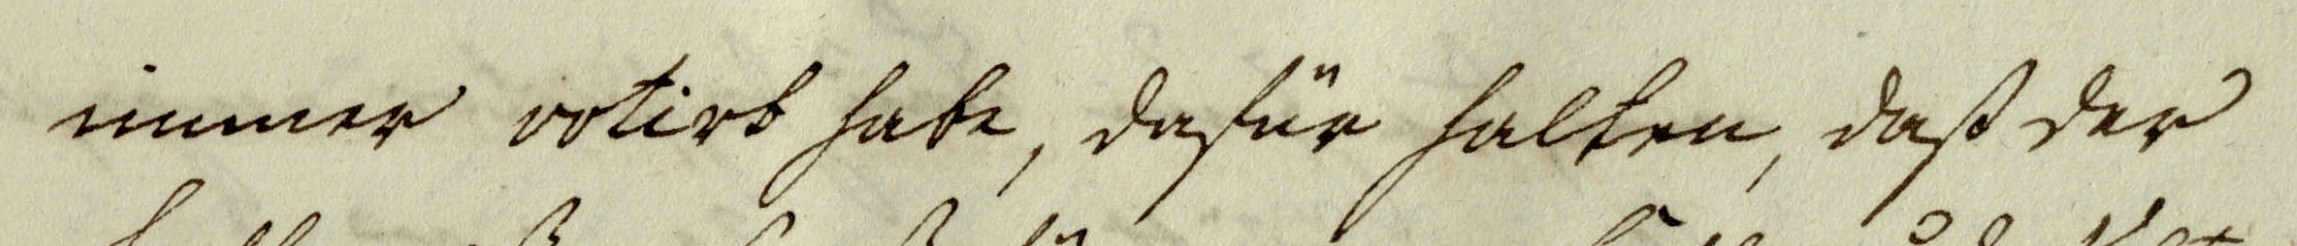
immer votirt habe, dafür halten, daß der
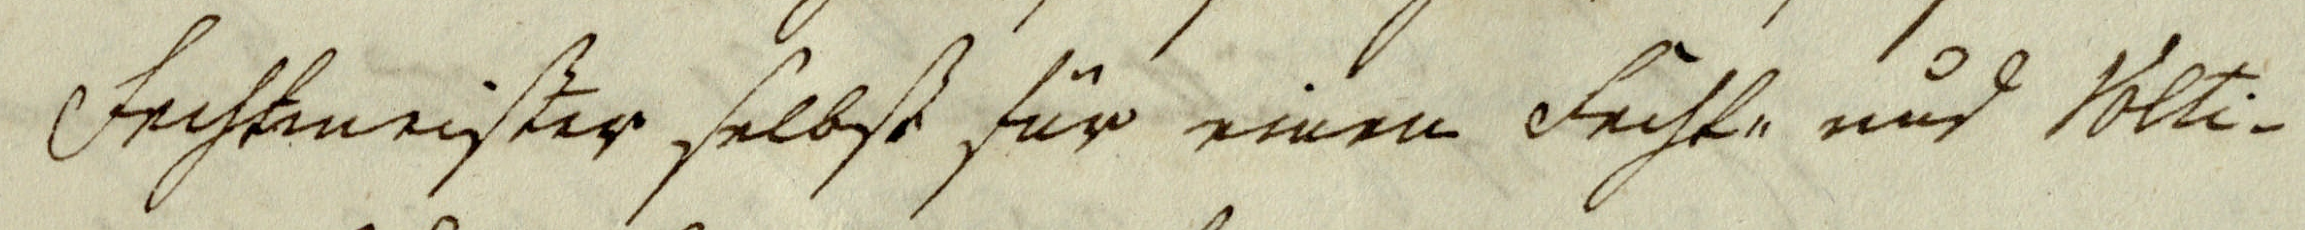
Fechtmeister selbst für einen Fecht- und Volti¬
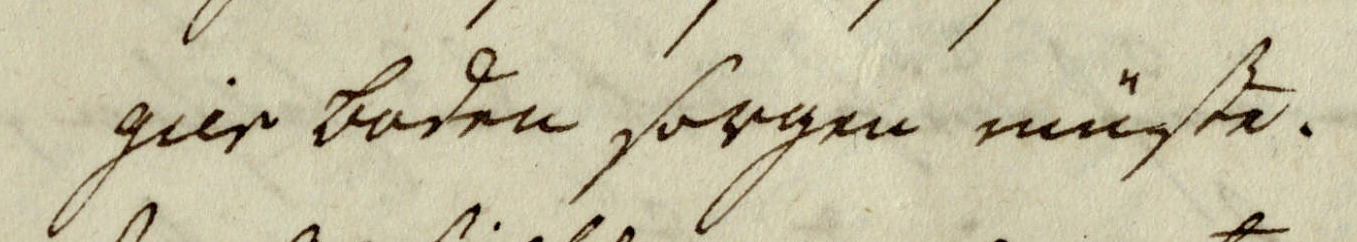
gier Boden sorgen müsste.
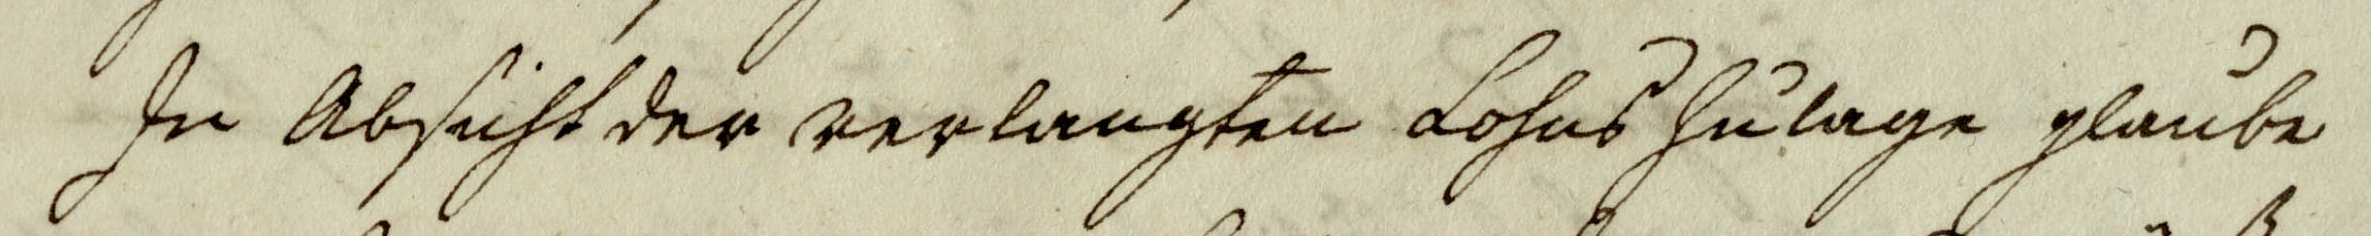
In Absicht der verlangten Lohns Zulage glaube
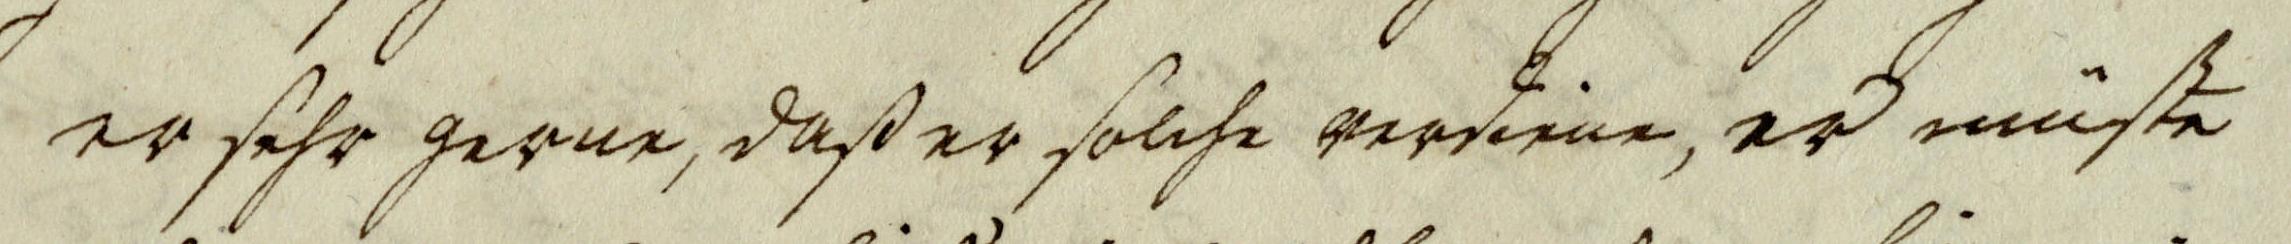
er sehr gerne, daß er solche verdiene, er müsste
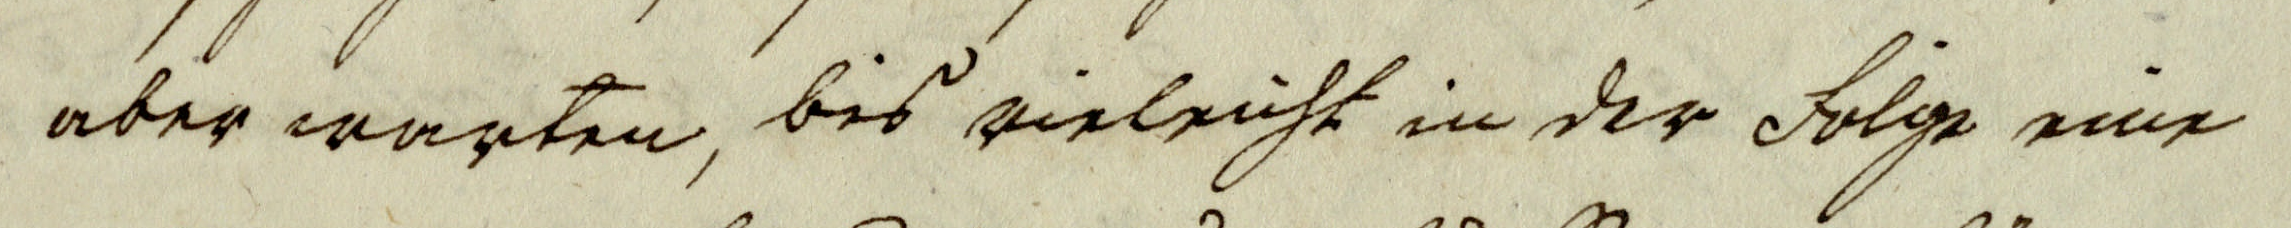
aber warten, bis vieleicht in der Folge eine
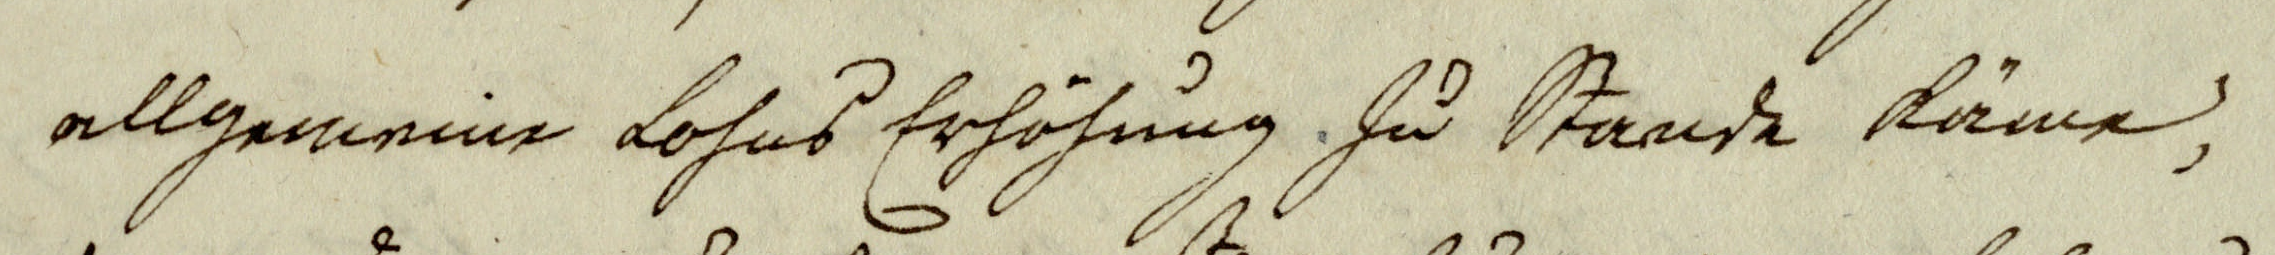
allgemeine Lohns Erhöhung zu Stande käme,
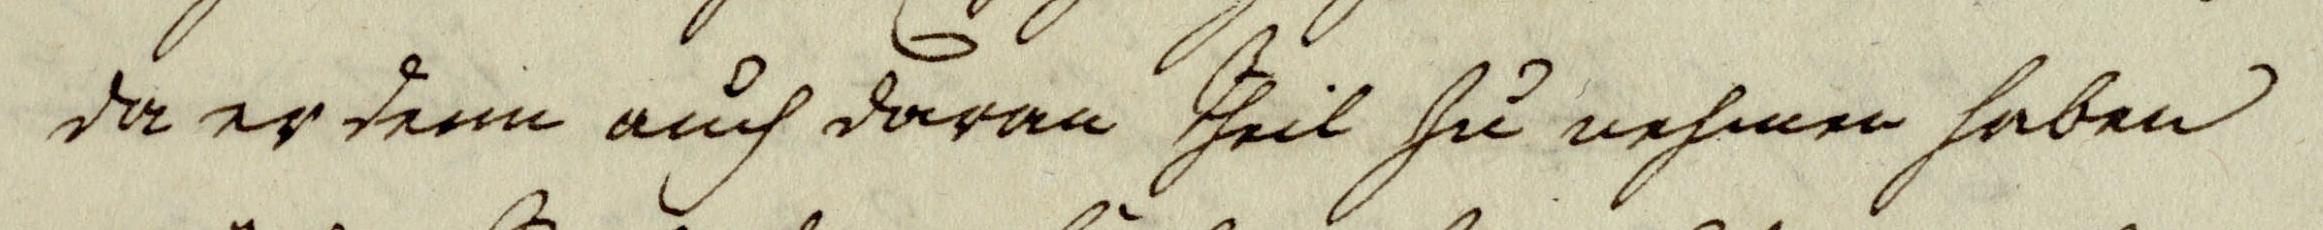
da er dann auch davon Theil zu nehmen haben
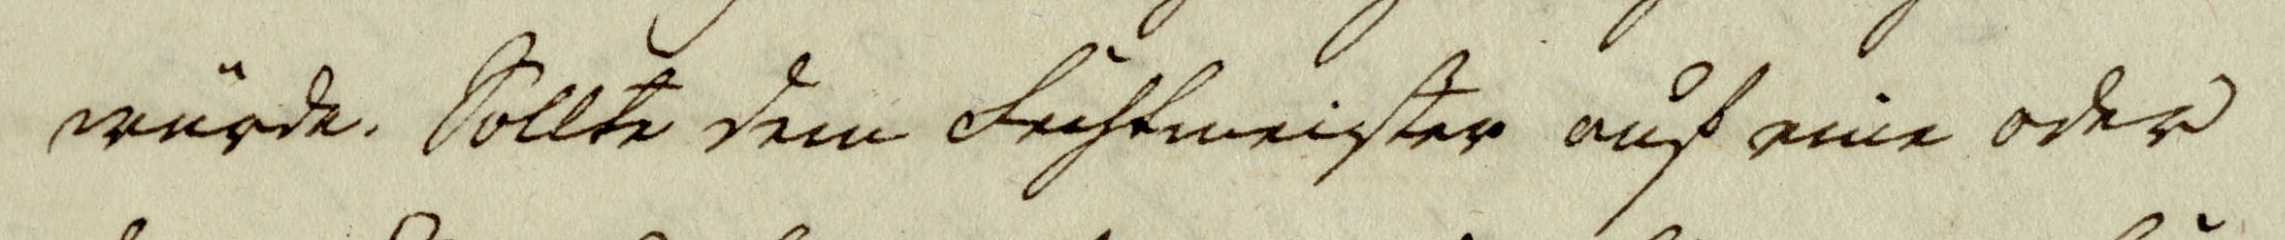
würde. Sollte dem Fechtmeister auf eine oder
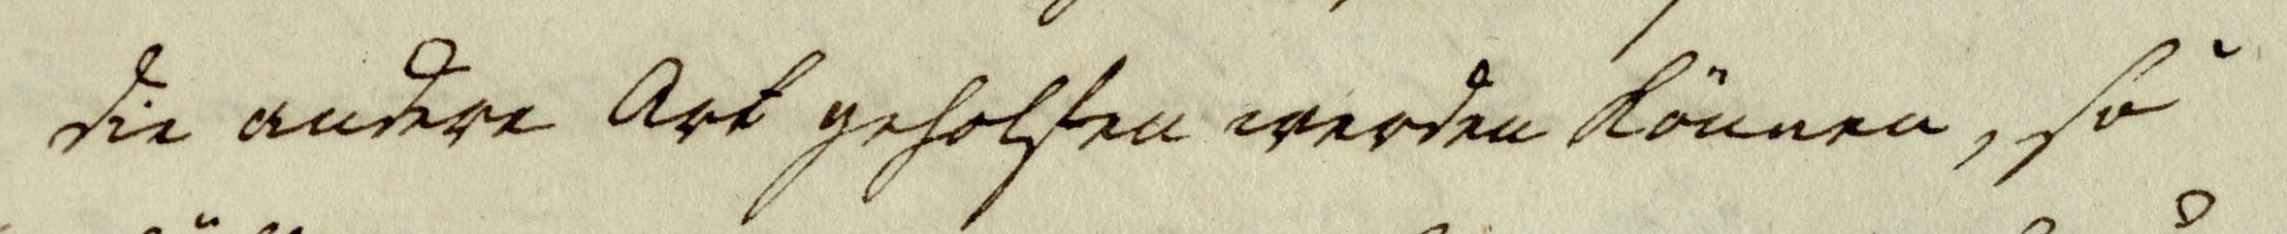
die andere Art geholfen werden können, so
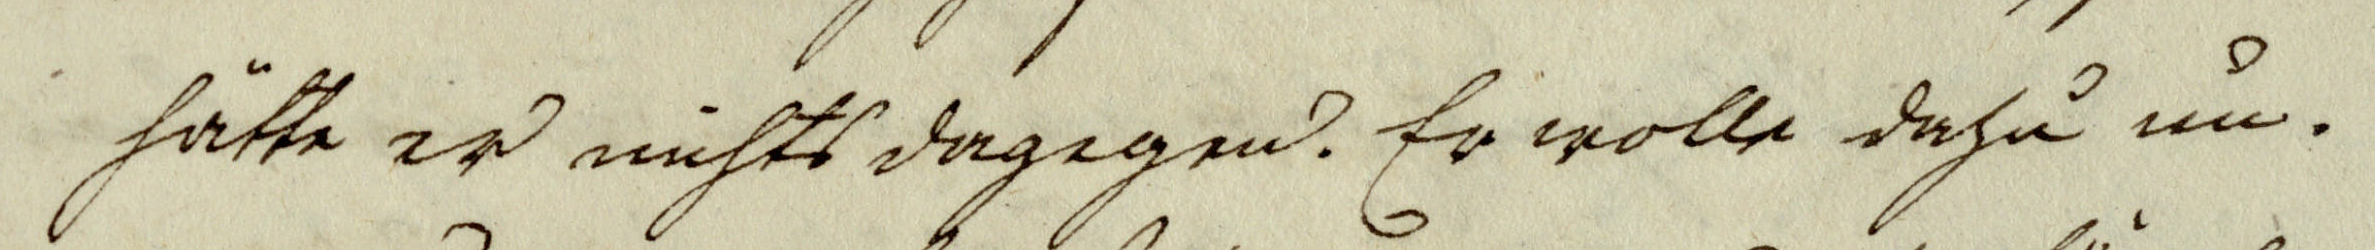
hätte er nichts dagegen. Er wolle dazu un¬
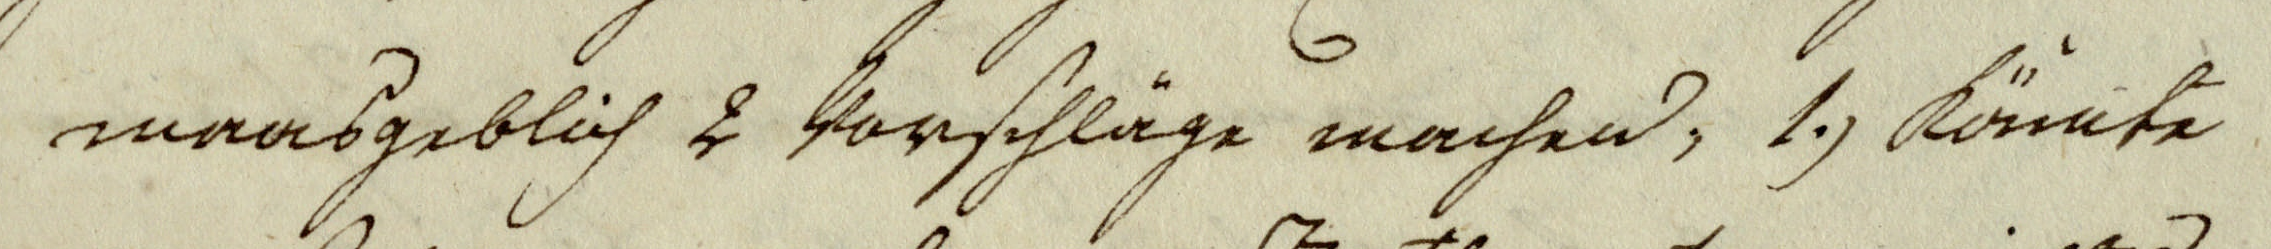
maasgeblich 2 Vorschläge machen; 1., könnte
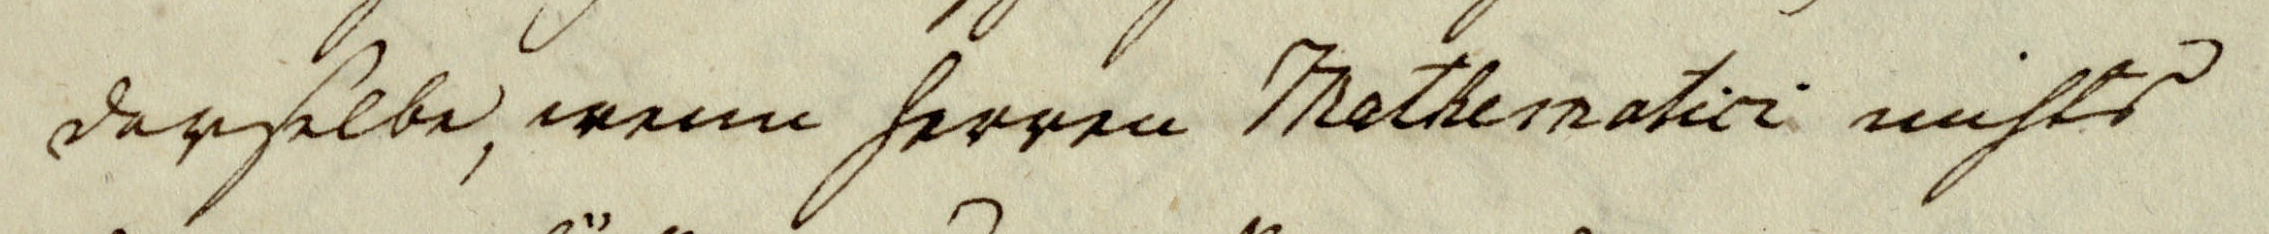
derselbe, wenn Herren Mathematici nichts
